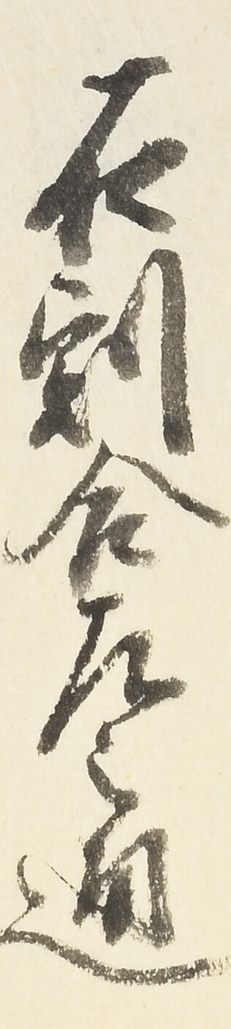右割合左之通
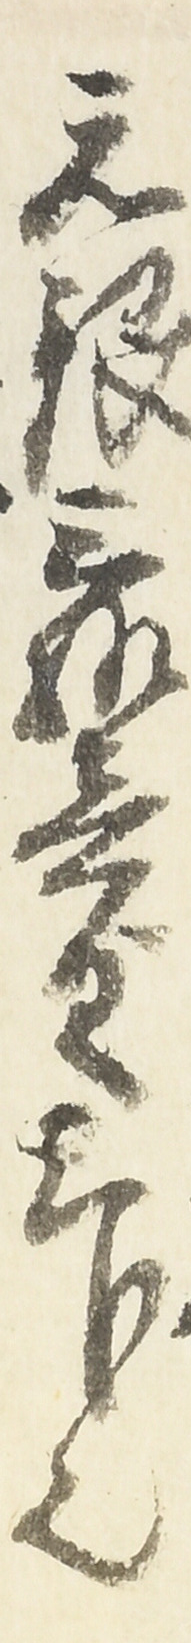元銀三拾壱匁三分也
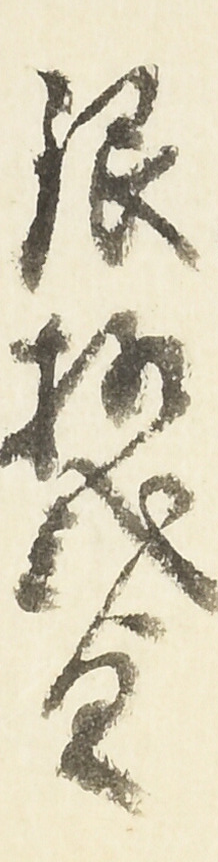銀拾弐匁
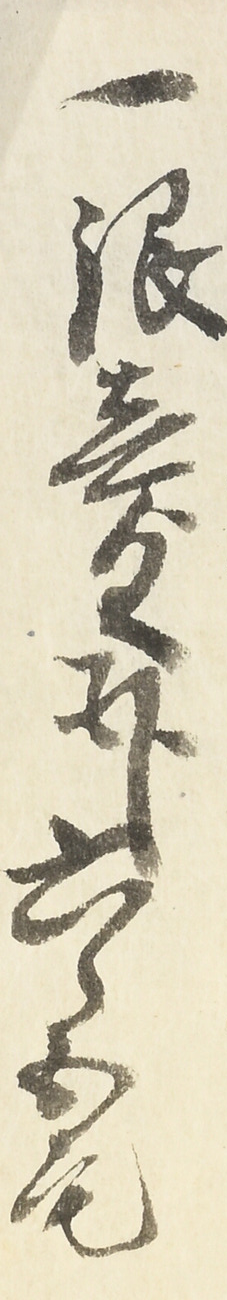一銀壱匁五分六厘五毛

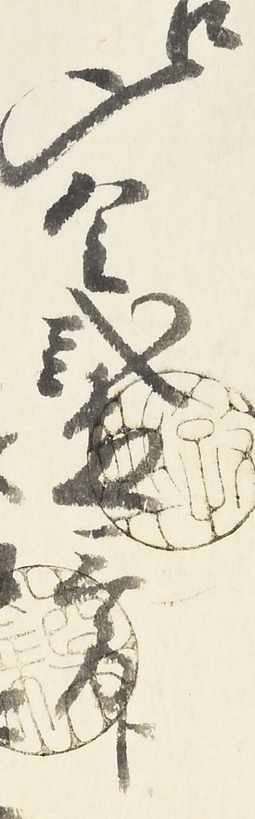〆金弐両三分ト
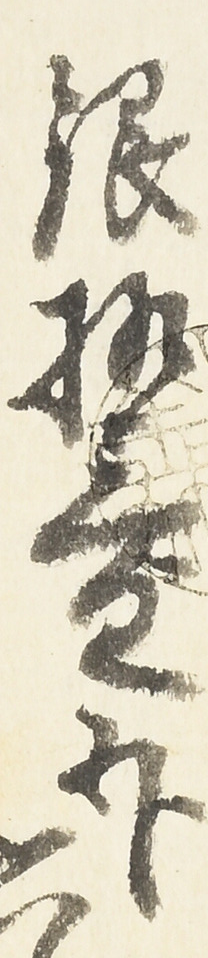銀拾三匁五分
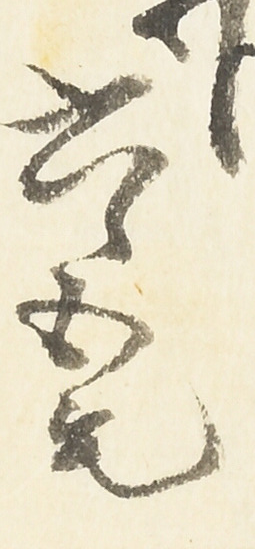六厘五毛
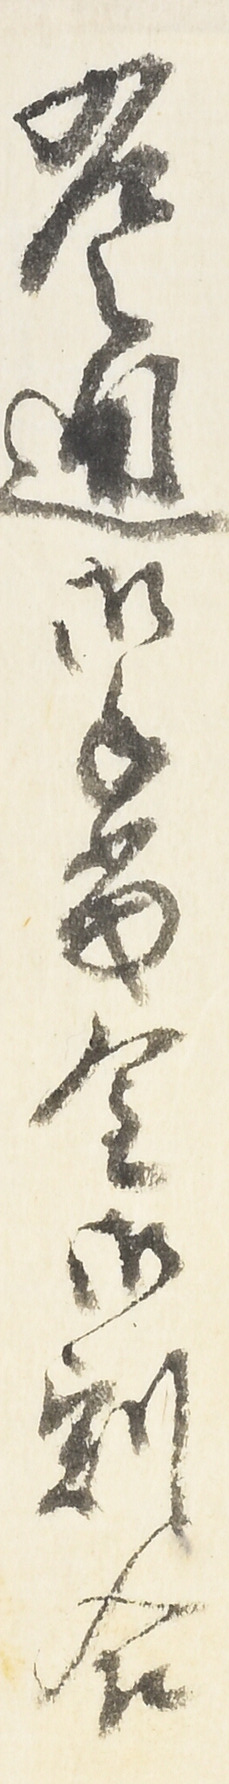右之通御手当金御割合
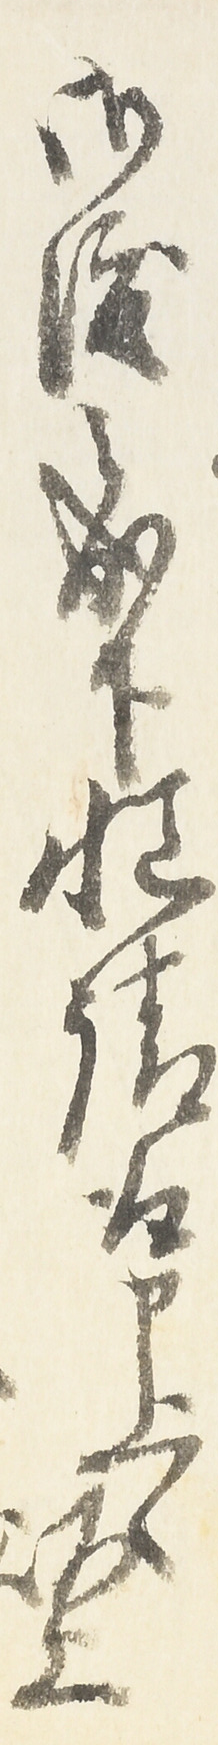御渡被成下慥請取申上候
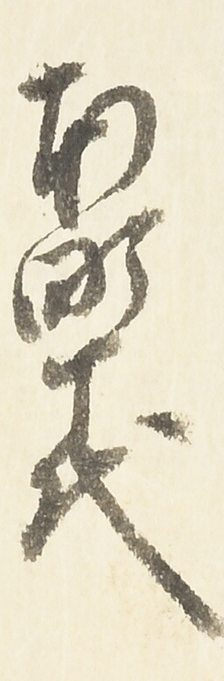本町丁代
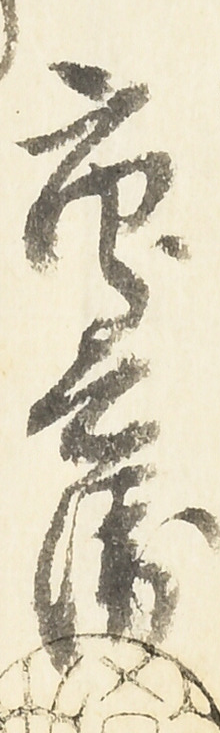勘兵衛
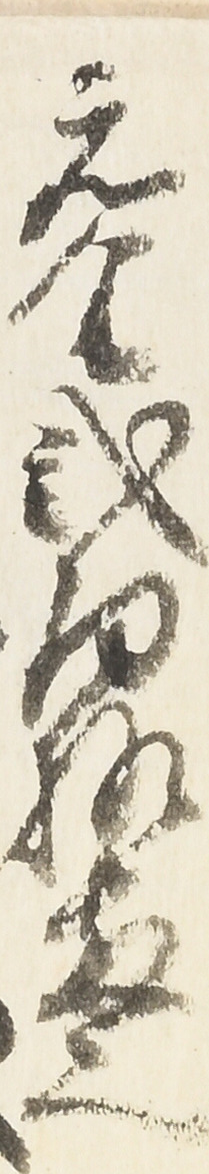元金弐百拾両也
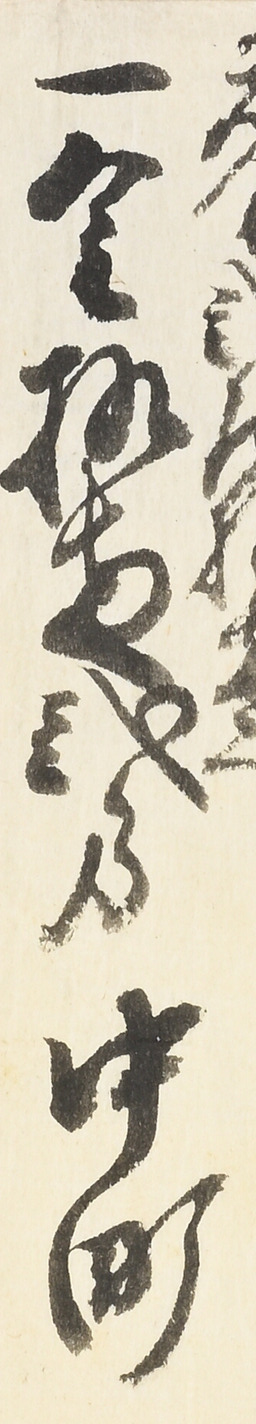一金拾両弐分中町
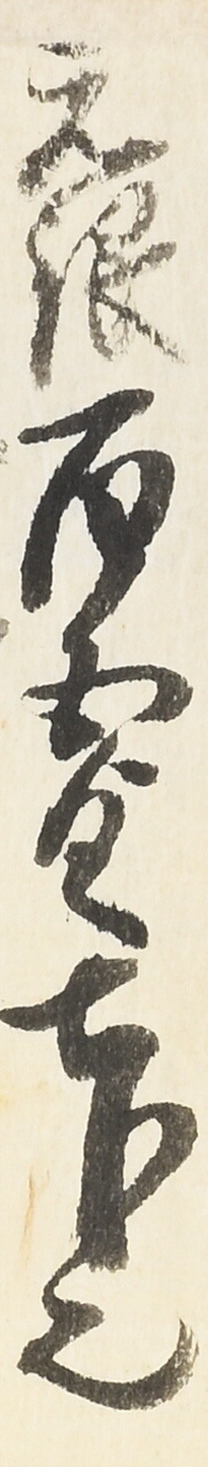元銀百五匁七分也
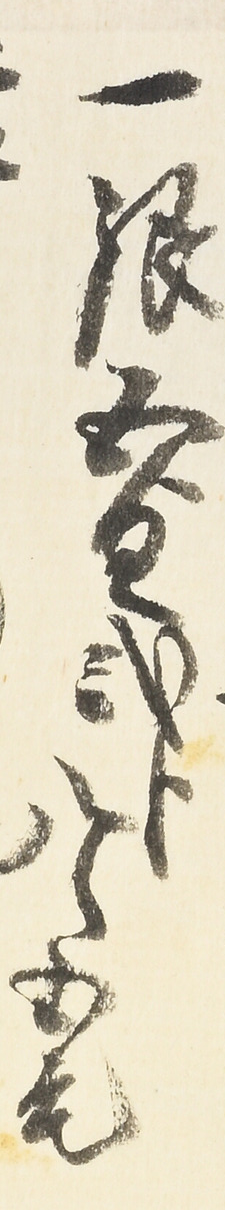銀五匁弐分八厘五毛
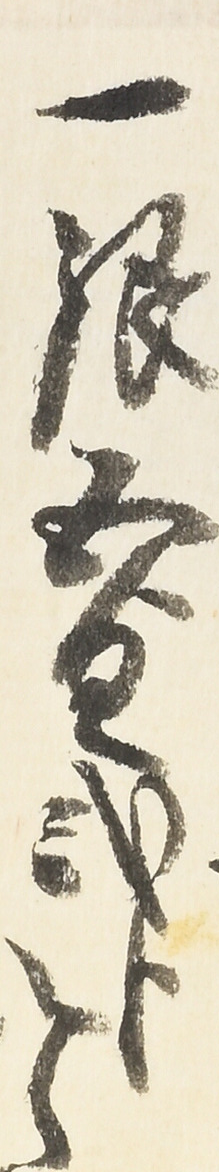一銀五匁弐分
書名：御才覚金御利足割渡扣帳
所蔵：伊那市立高遠町図書館・合同会社AMANE
